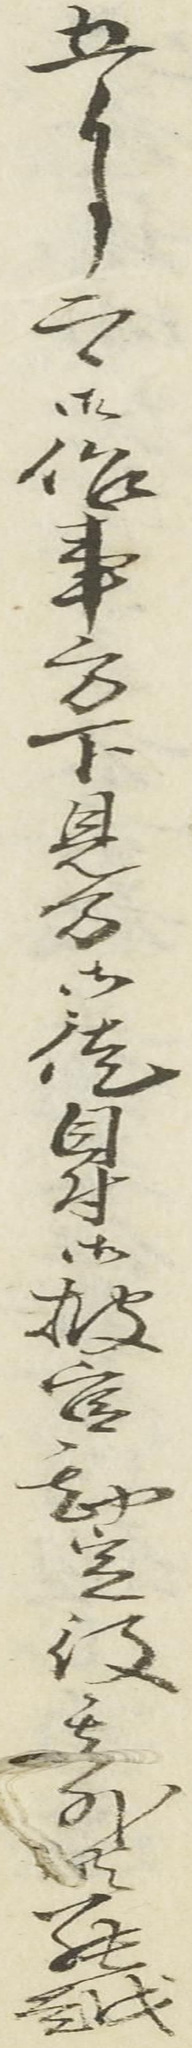五月二日御作事方下見分御徒目付御被官勘定役其外共罷越
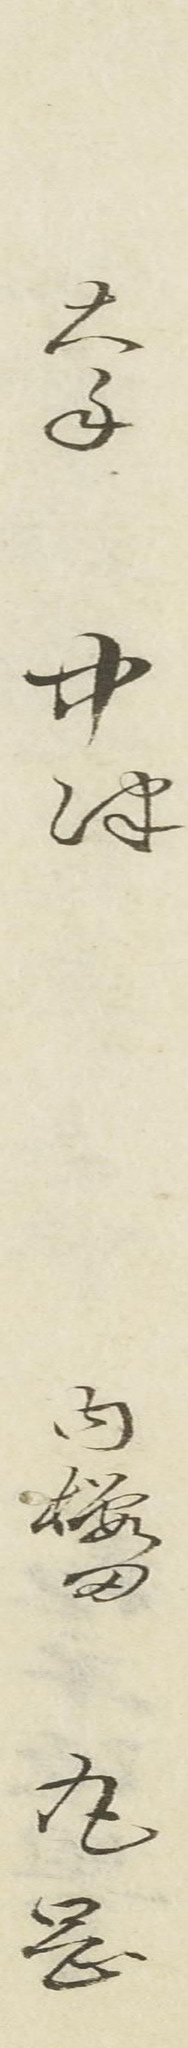大手中津内桜田丸岡
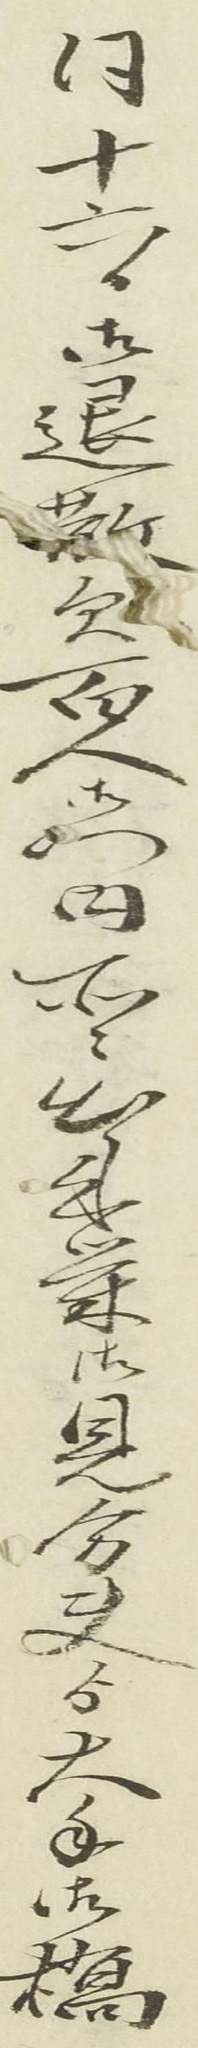同十六日御退散欠百人御門内所々出来栄御見分夫ゟ大手御橋
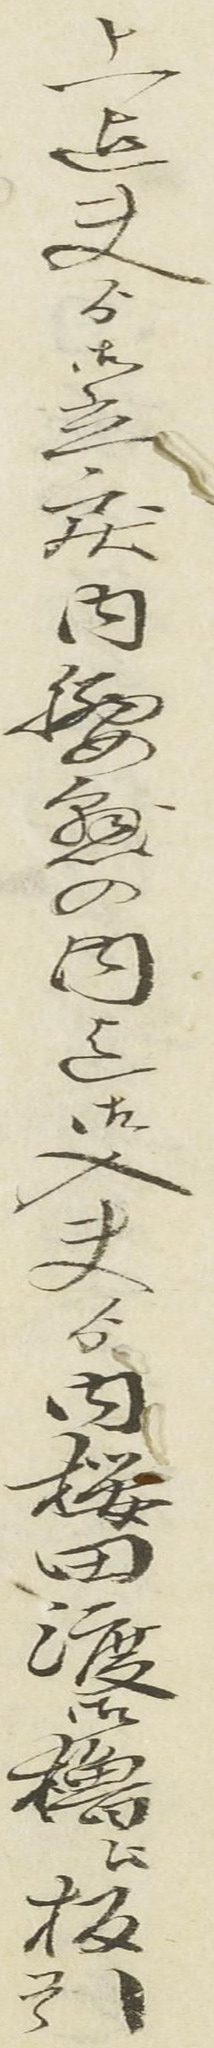上迄夫ゟ御立戻内腰懸の内迄御入夫ゟ内桜田渡御櫓え板引
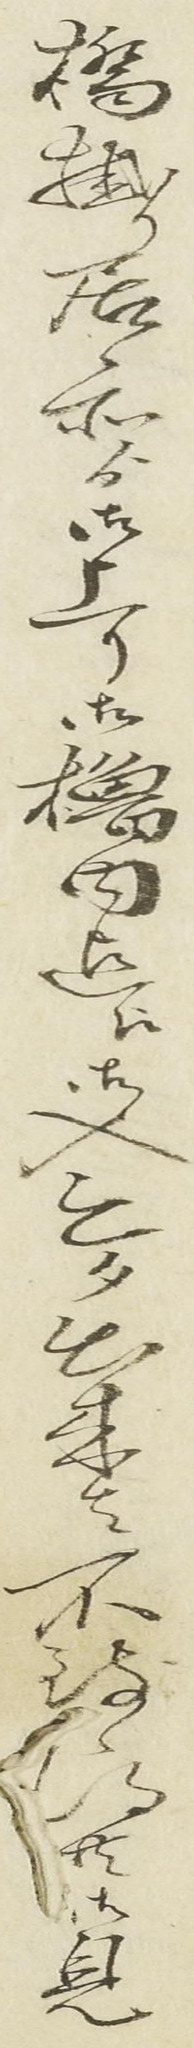橋掛り居候所ゟ御上り御櫓内迄え御入今タ出来は不致候得共御見
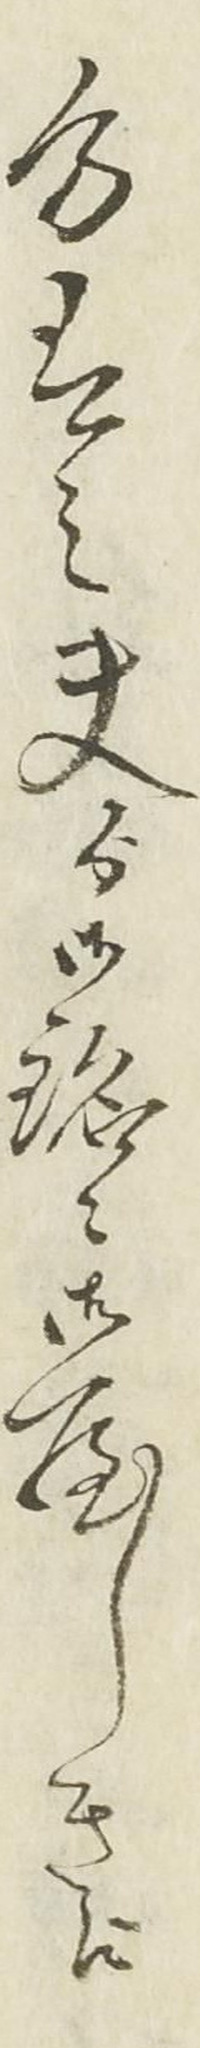分有之夫ゟ御銘々御屋しきえ
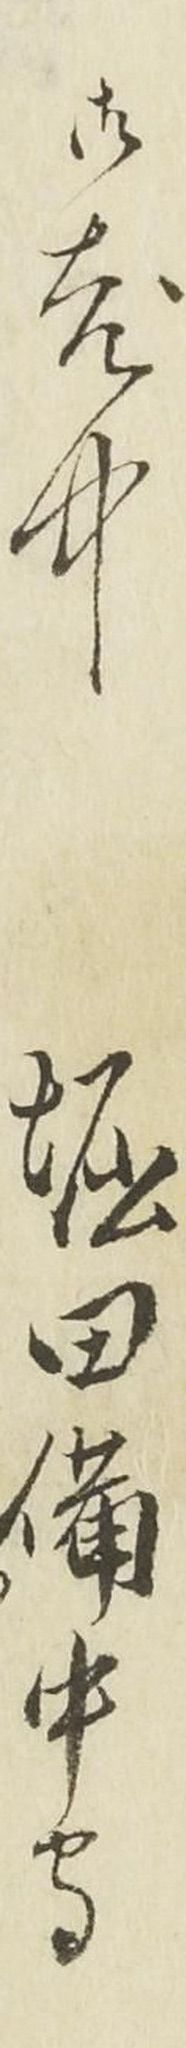御老中堀田備中守
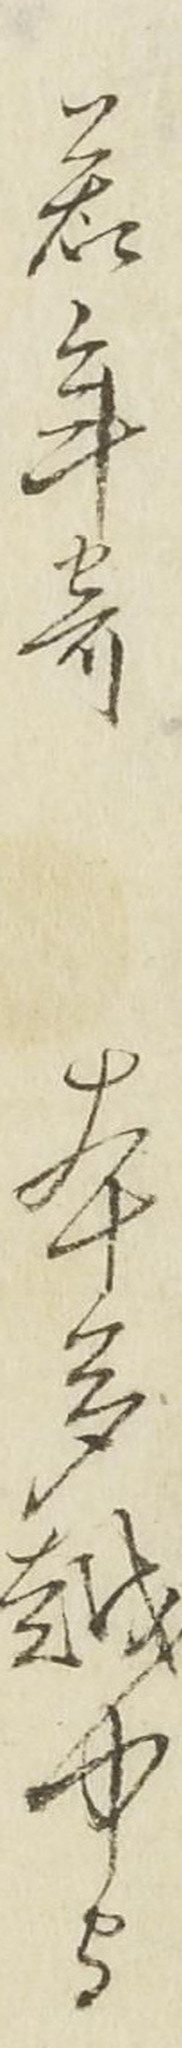若年寄本多越中守
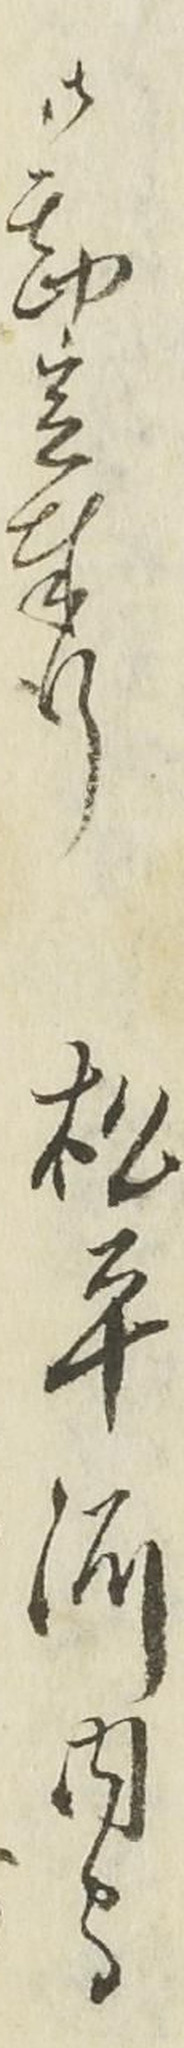御勘定奉行松平河内守
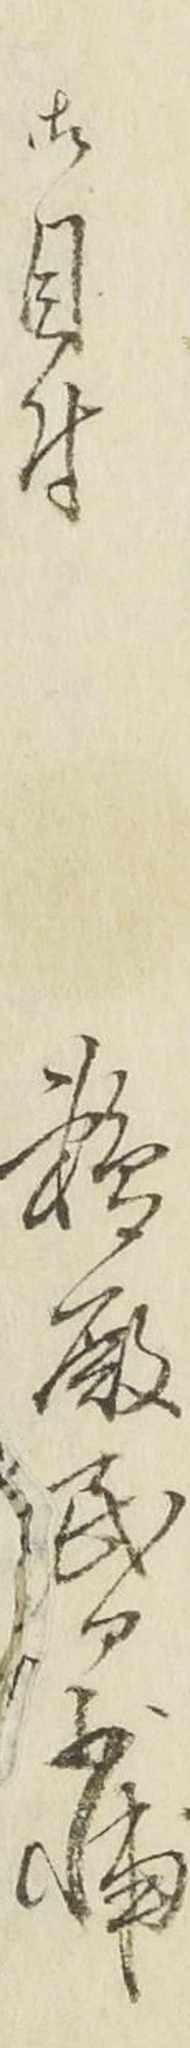御目付鵜殿民部少輔
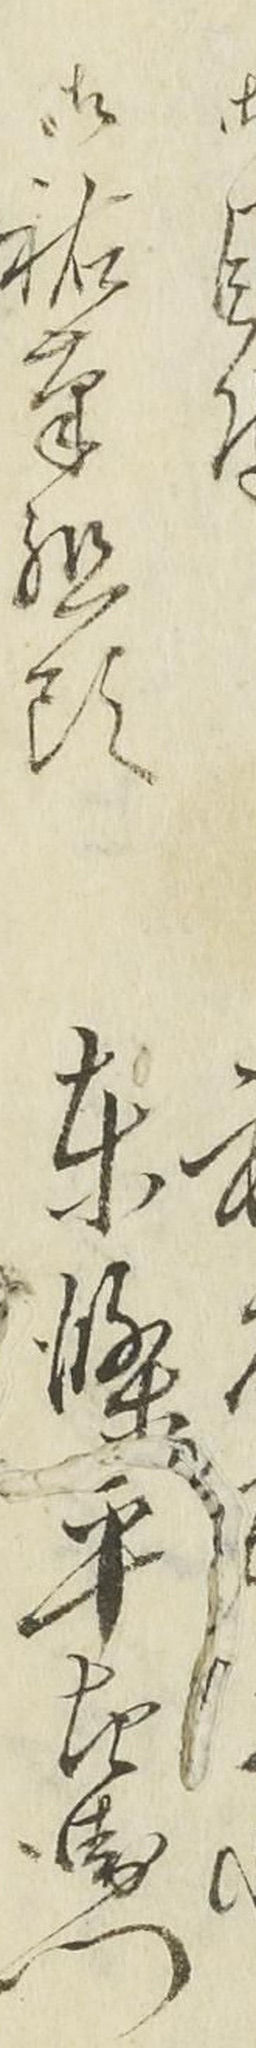御祐筆組頭東條平左衛門
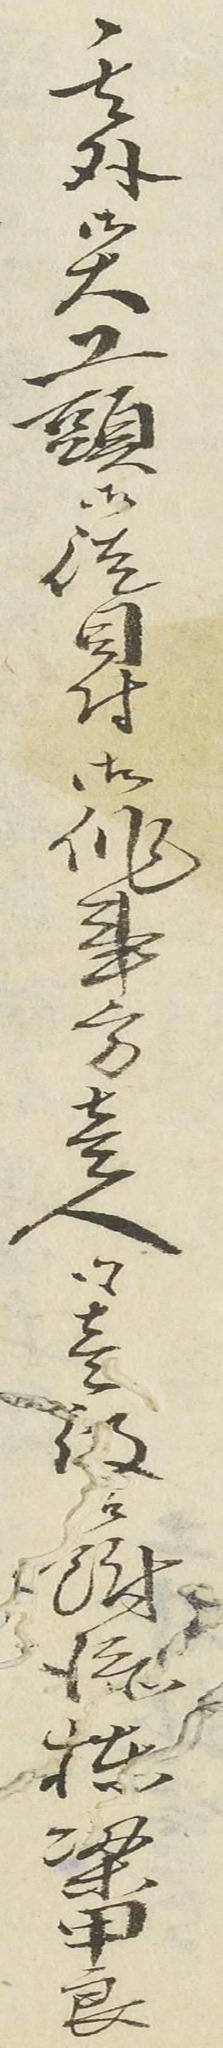其外御大工頭御徒目付御作事方壱人以上壱役え附添棟梁甲良
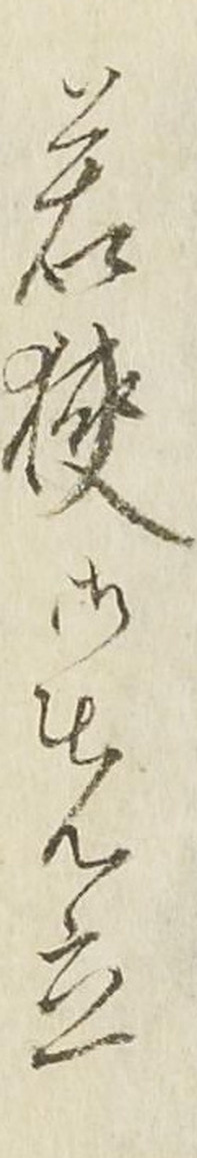若狭御先立

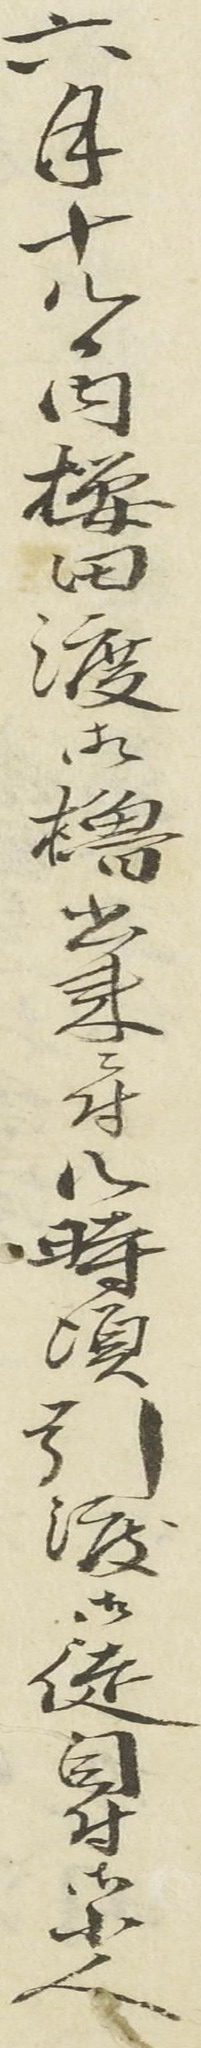六月十八日内桜田渡御櫓出来に付八時頃引渡御徒目付御小人
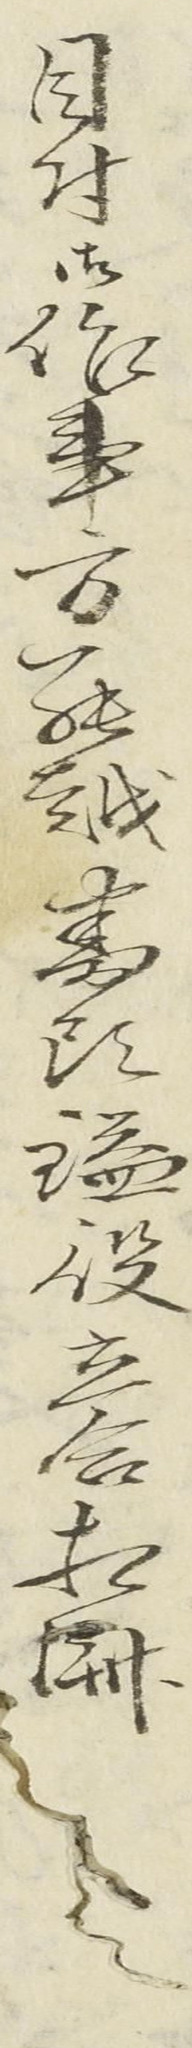目付御作事方罷越番頭鎰役立合相済
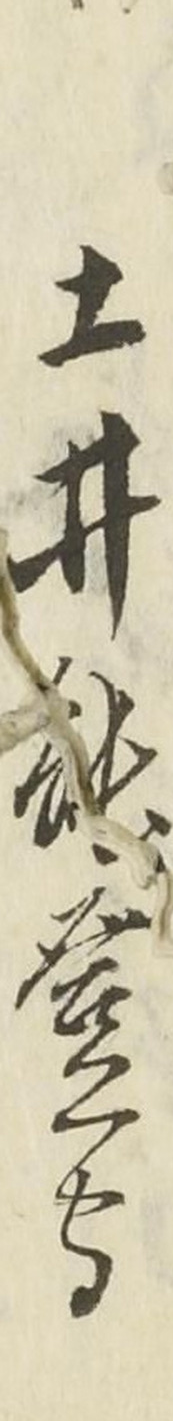ト土井能登守
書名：安政二乙卯年十月二日大地震之事
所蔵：東京大学地震研究所図書室 Earthquake Research Institute Library, The University of Tokyo, JAPAN
